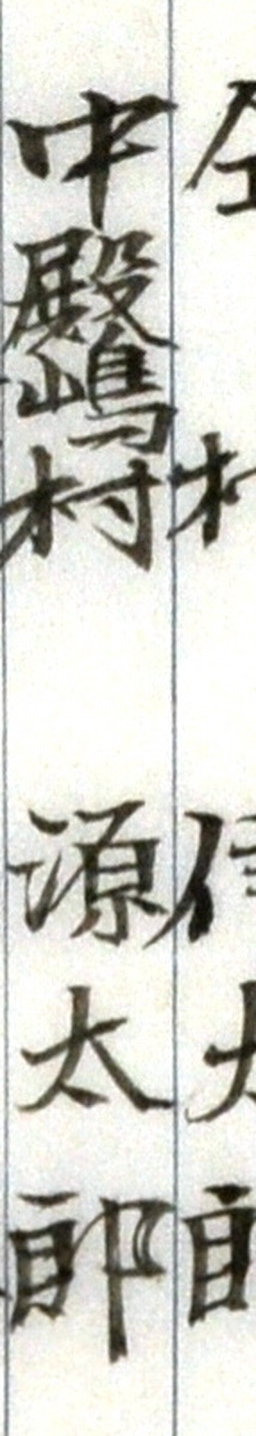中殿嶋村源太郎
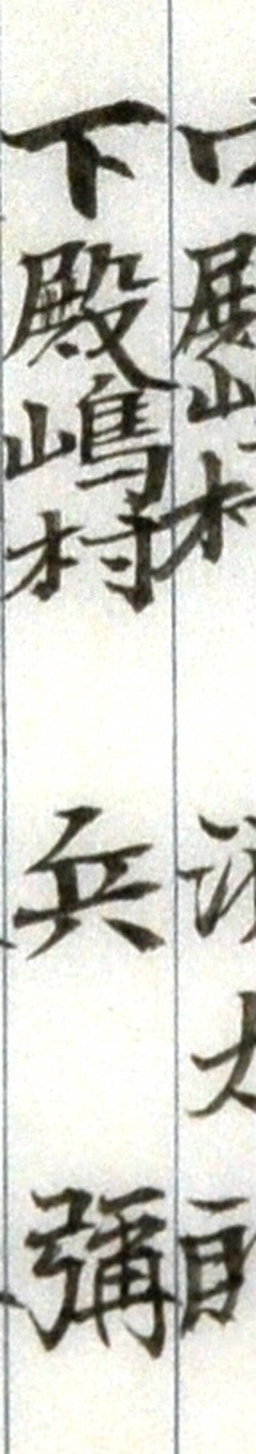下殿嶋村兵弥

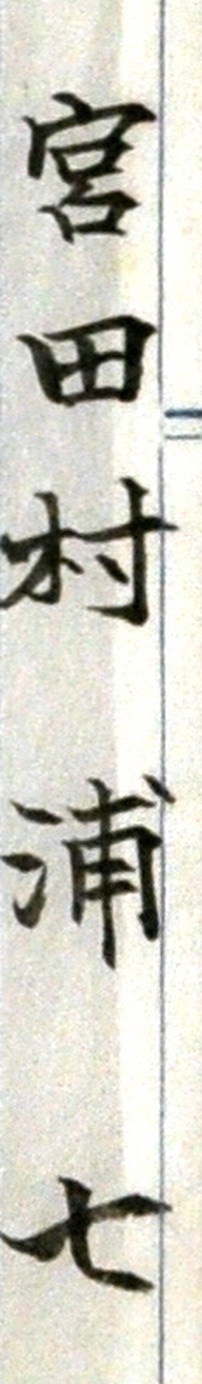宮田村浦七
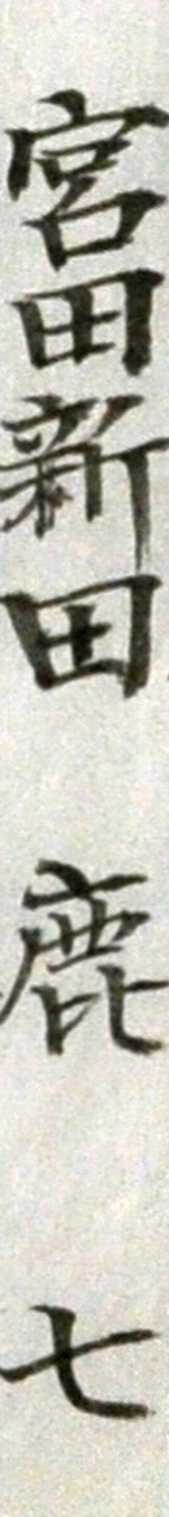宮田新田鹿七
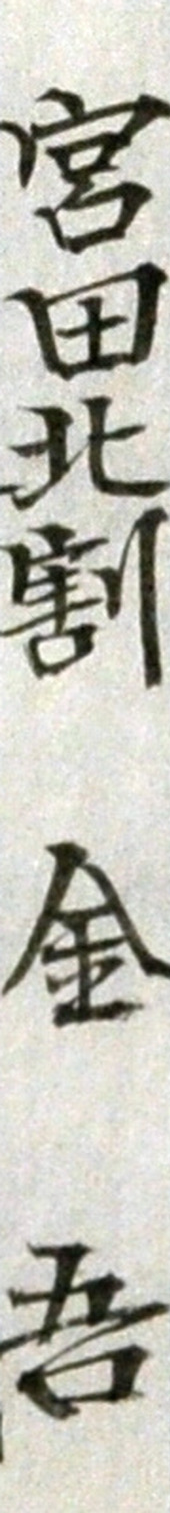宮田北割金吾
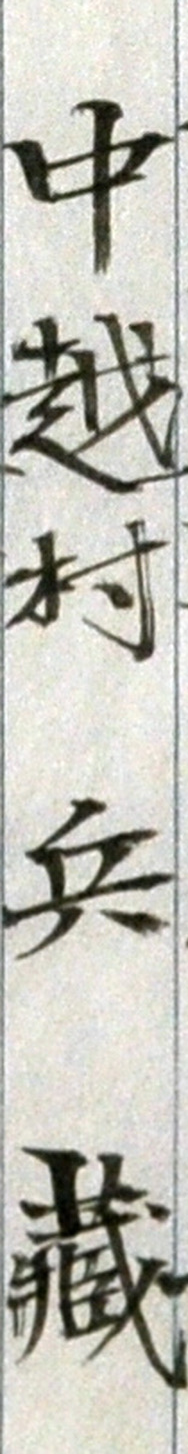中越村兵蔵
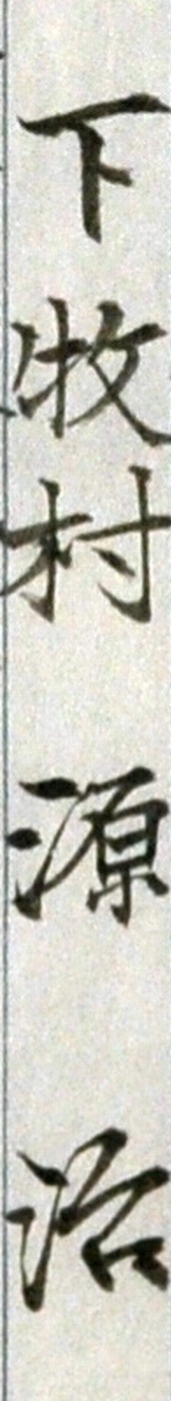下牧村源治
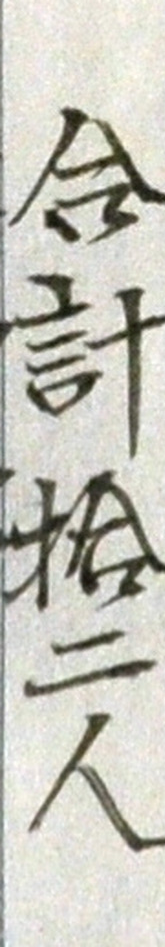合計拾二人
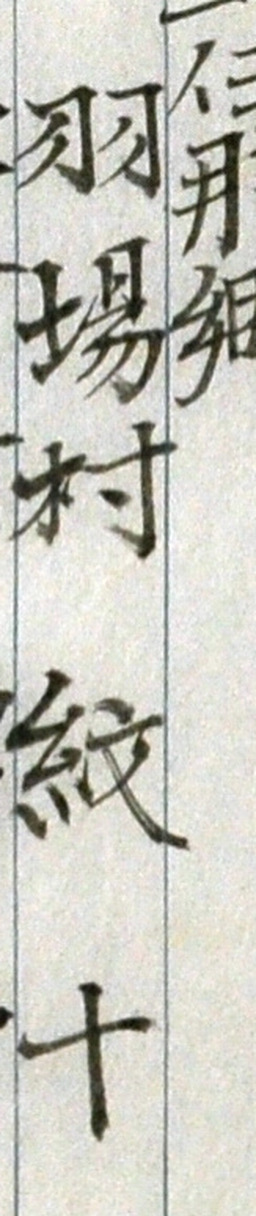羽場村紋十
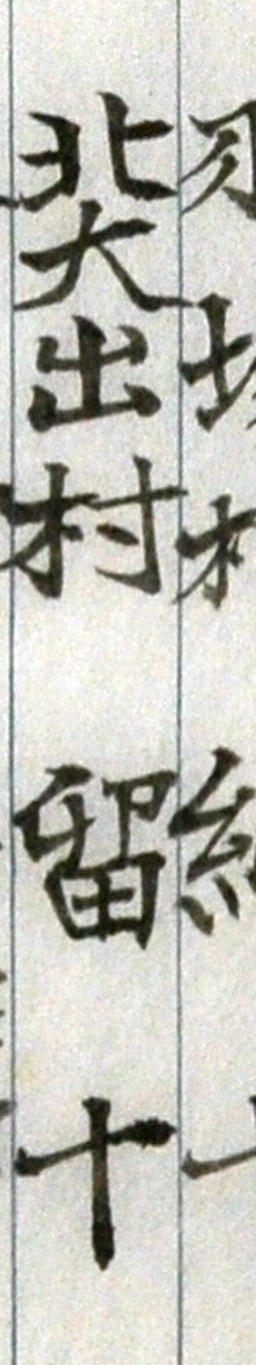北大出村留十
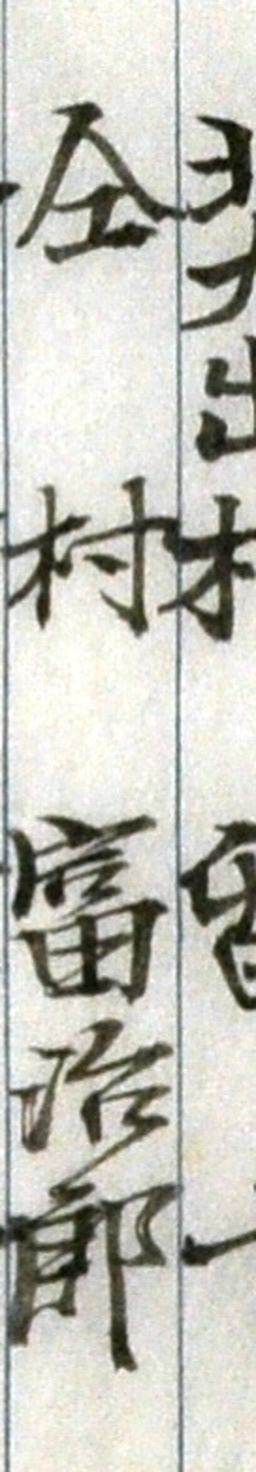同村富治郎
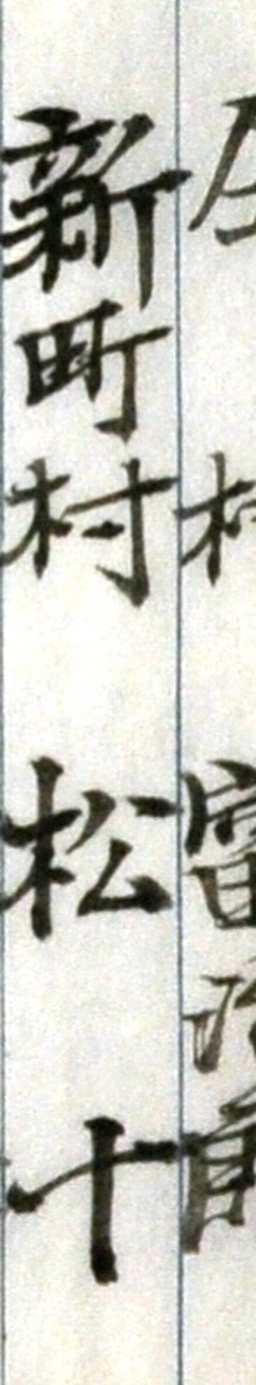新町村松十
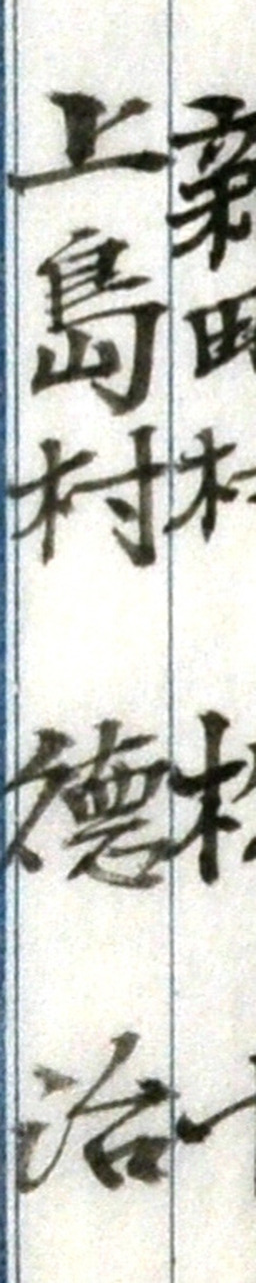上島村徳治
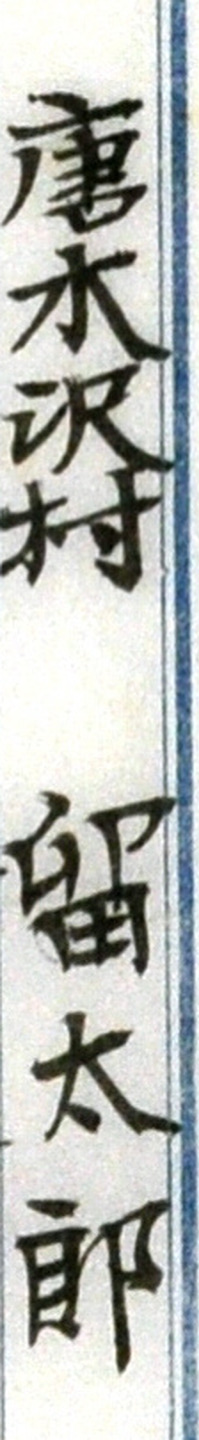唐木沢村留太郎
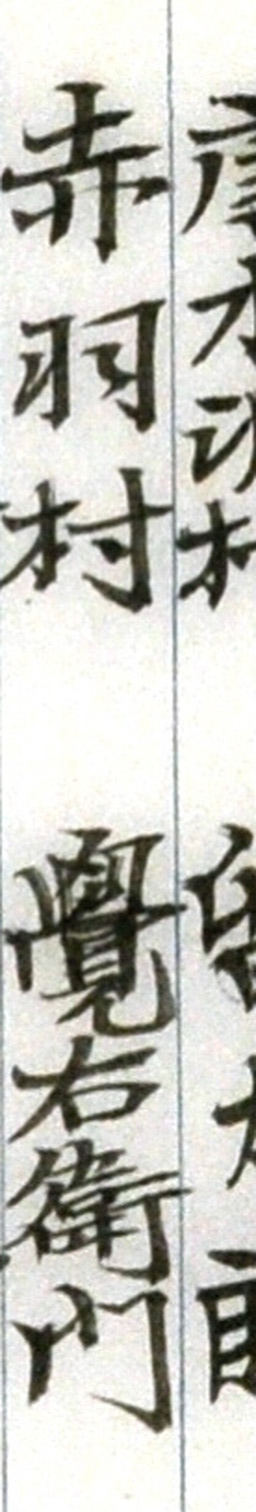赤羽村覚右衛門
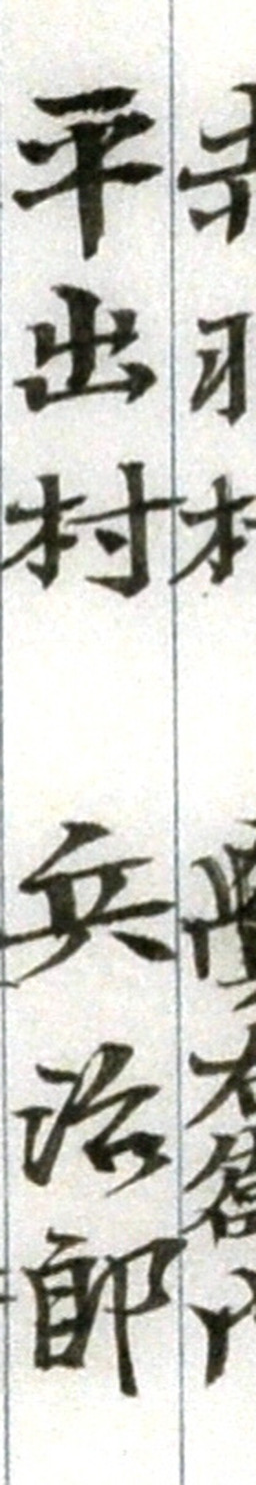平出村兵治郎
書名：高遠藩兵員名簿歩兵銃隊・郷村募集員
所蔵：伊那市立高遠町図書館・合同会社AMANE
